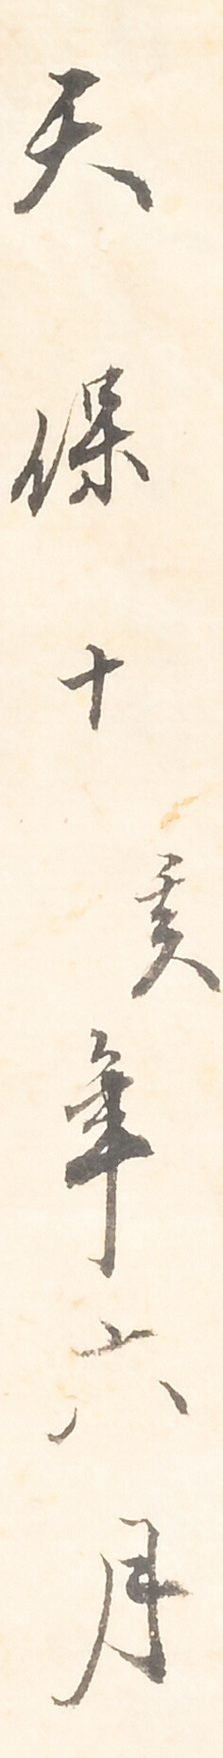天保十亥年六月
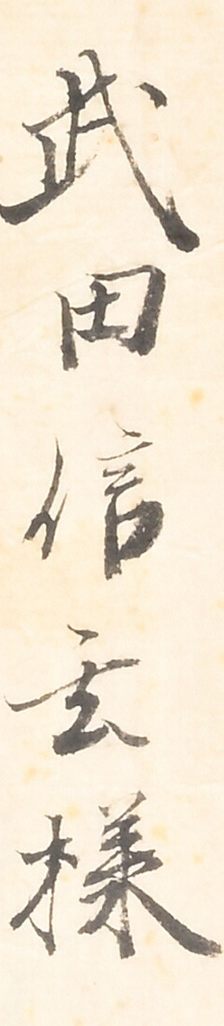武田信玄様
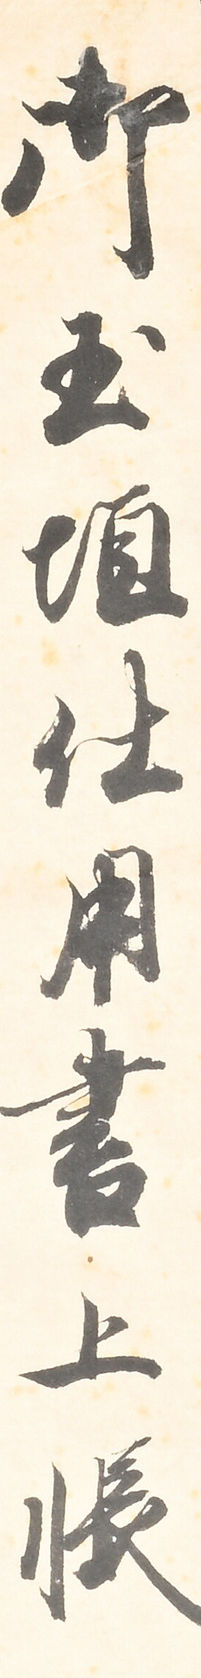御玉垣仕用書上帳
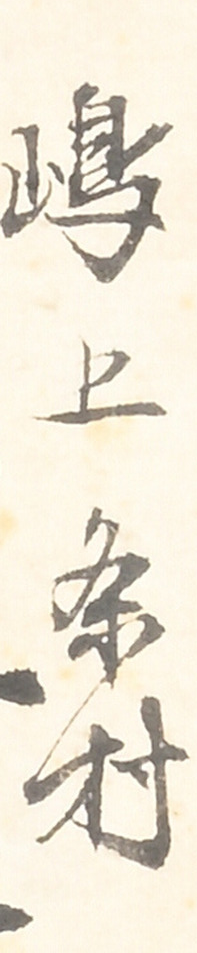島上条村
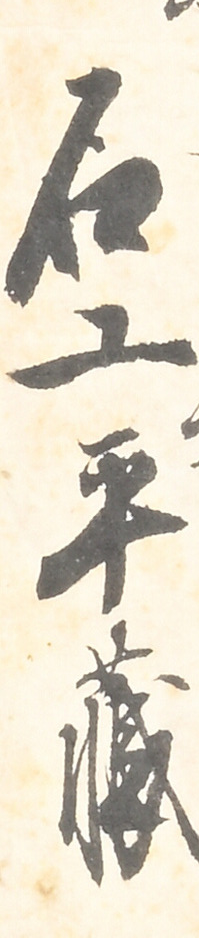石工平蔵

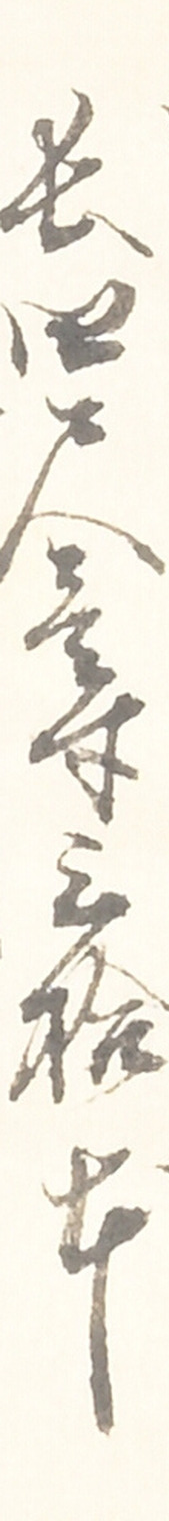長四尺壱寸三拾本
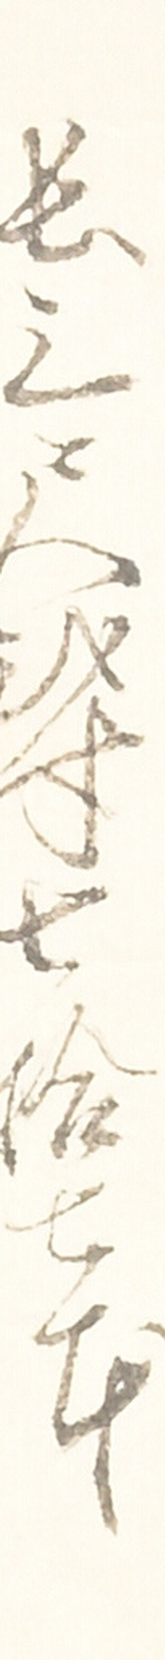長三尺弐寸七拾七本
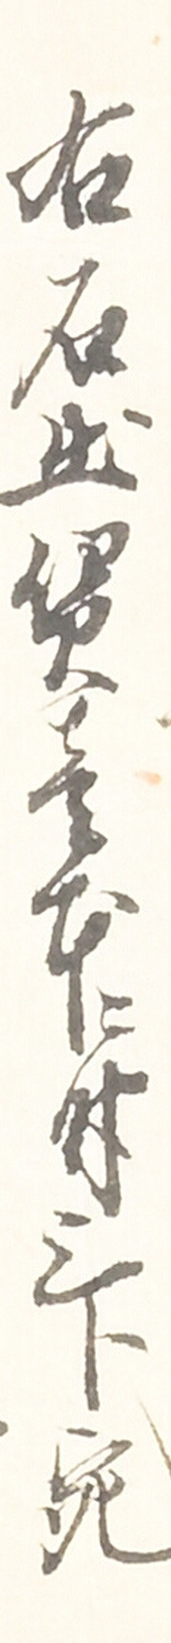右石出賃壱本ニ付三分宛
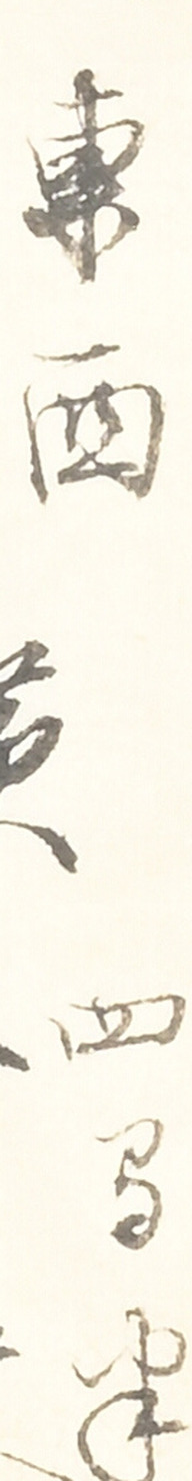東西四間半
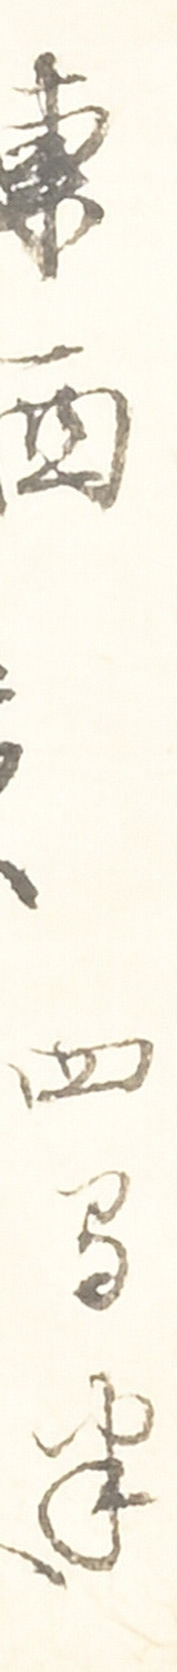東西四間半
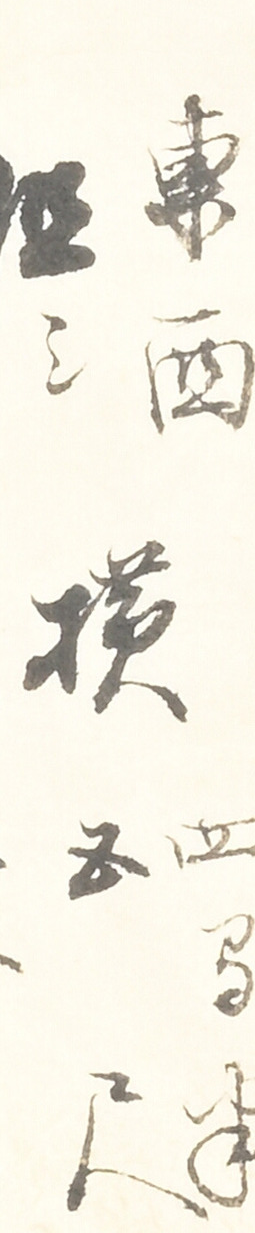但シ横五尺
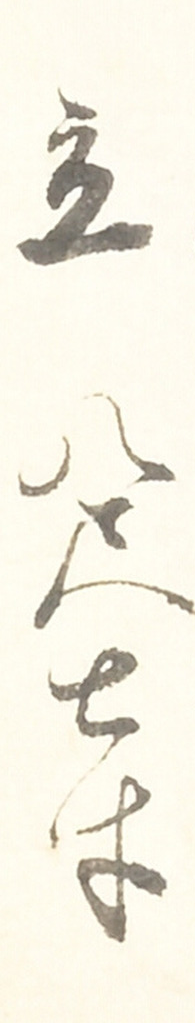立八尺七寸

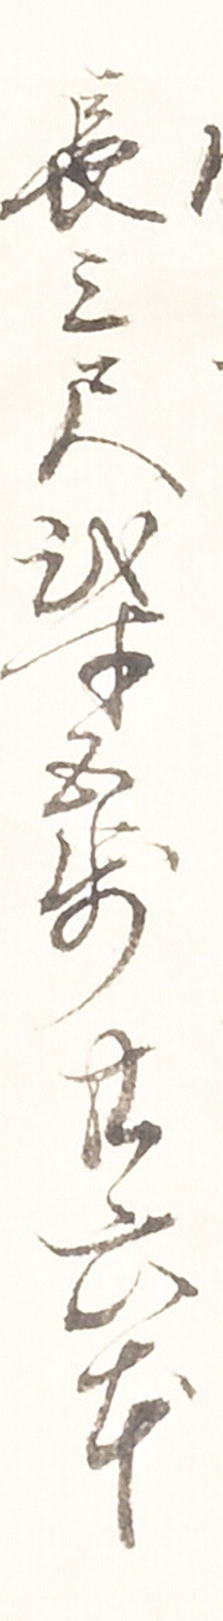長三尺弐寸五歩廿六本
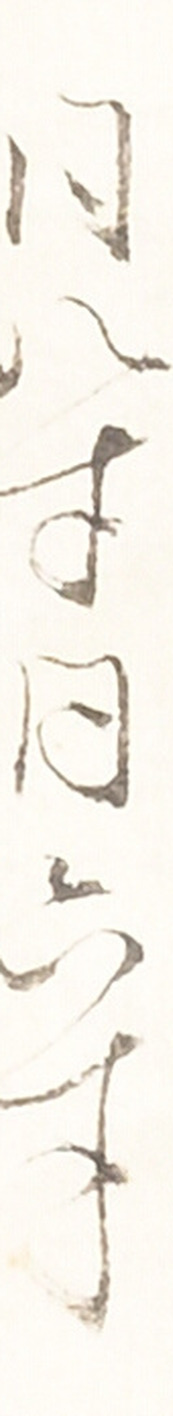同八寸同六寸
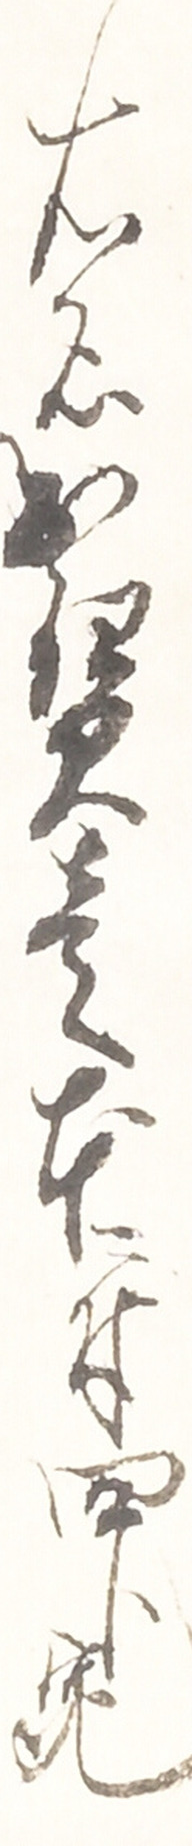但右石出賃壱本ニ付四分宛
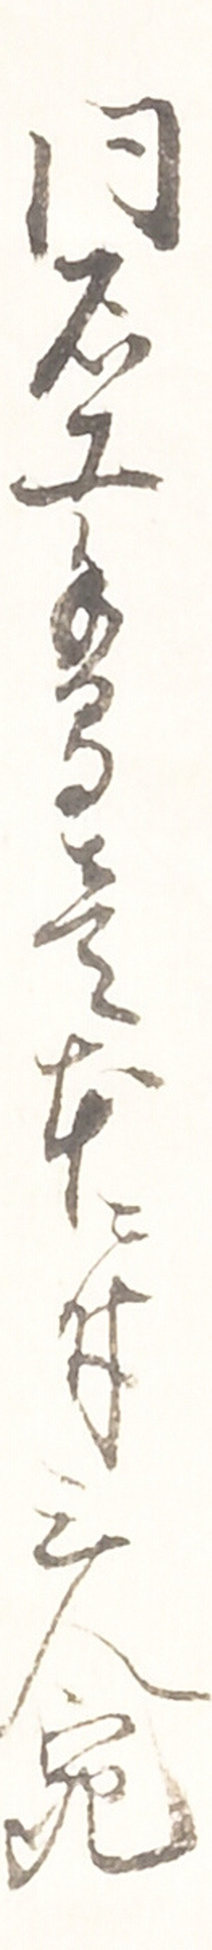同石工手間壱本ニ付三人宛
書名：天保十亥年六月武田信玄様御玉垣仕様書上帳
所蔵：伊那市立高遠町図書館・合同会社AMANE
